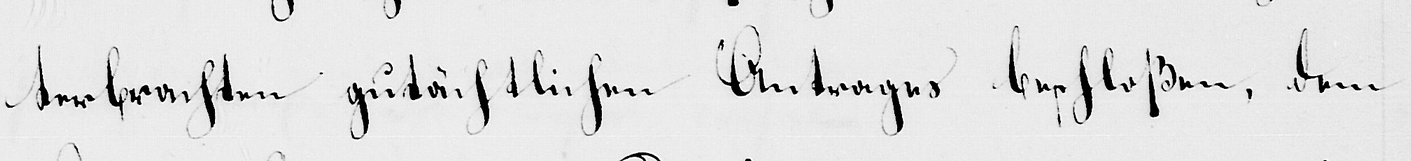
terbrachten gutächtlichen Antrages beschloßen, dem
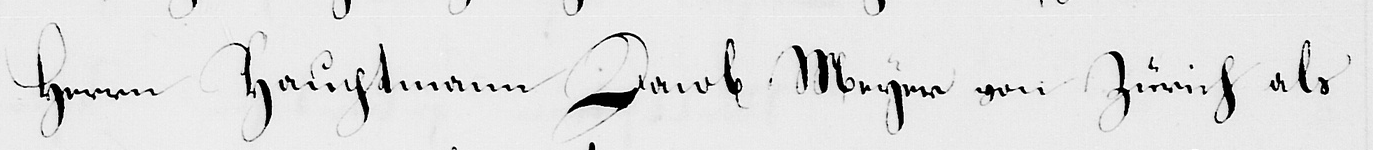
Herrn Hauptmann Jacob Meyer von Zürich als
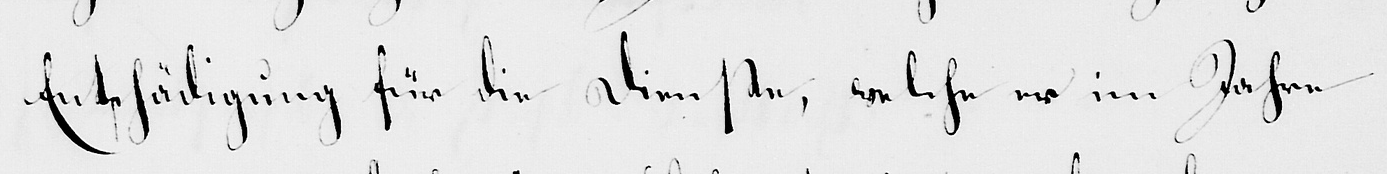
Entschädigung für die Dienste, welche er im Jahre
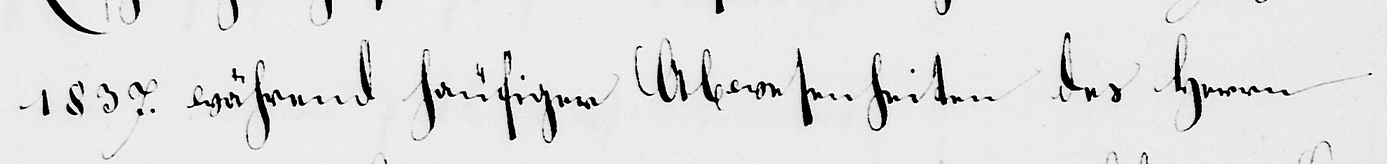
1837. während häufiger Abwesenheiten des Herrn
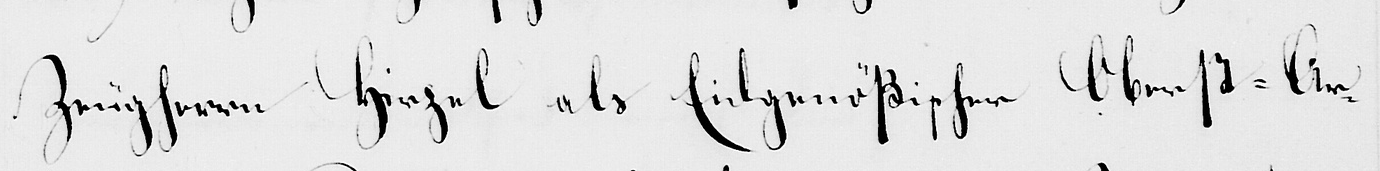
Zeugherrn Hirzel als Eidgenößischer Oberst-Ar¬
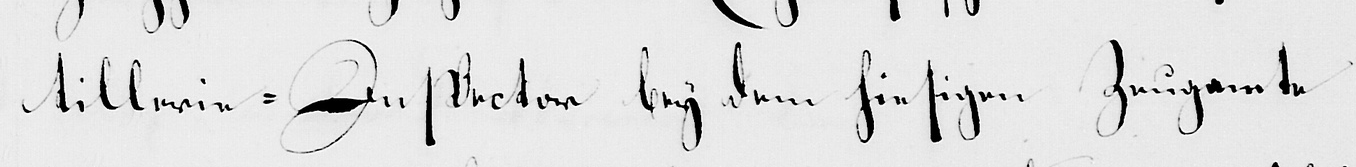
tillerie-Inspector bey dem hiesigen Zeugamte
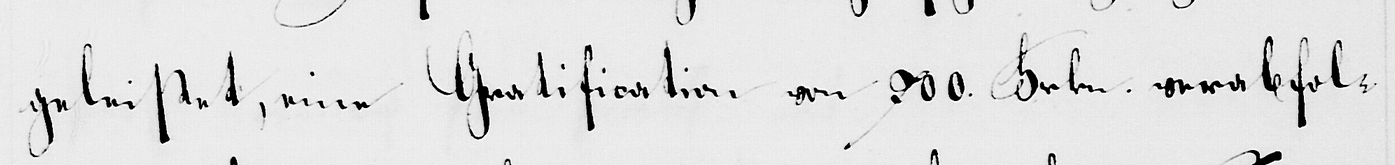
geleistet, eine Gratification von 700. Frkn. verabfol¬
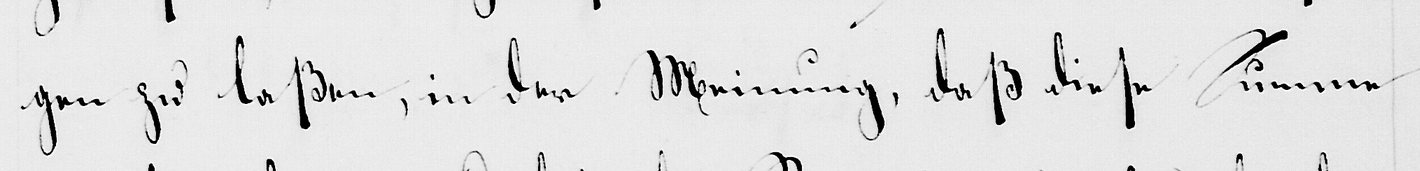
gen zu laßen, in der Meinung, daß diese Summe
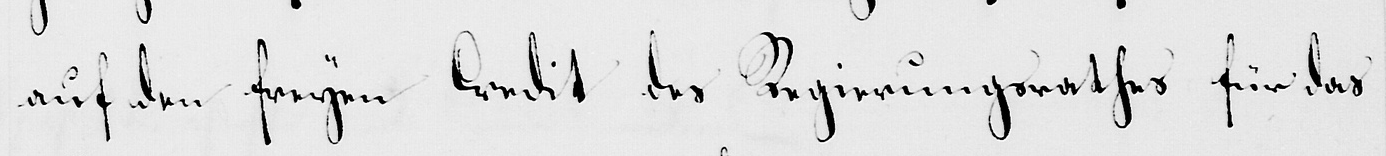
auf den freyen Credit des Regierungsrathes für das
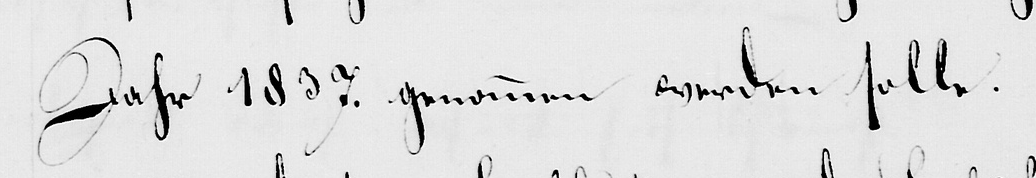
Jahr 1837. genommen werden solle.
